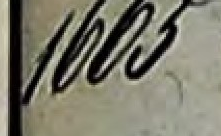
1665
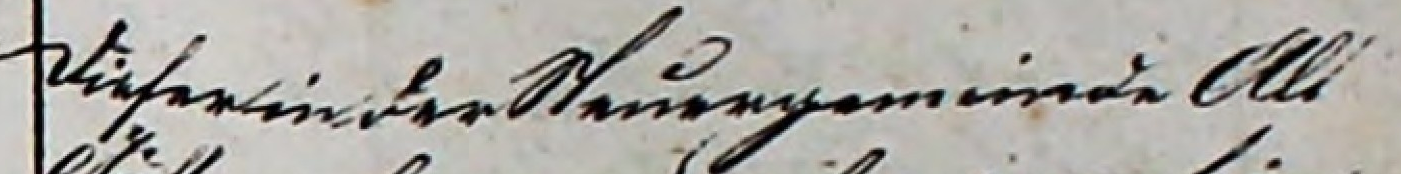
dieser in Steuergemeinde Alt
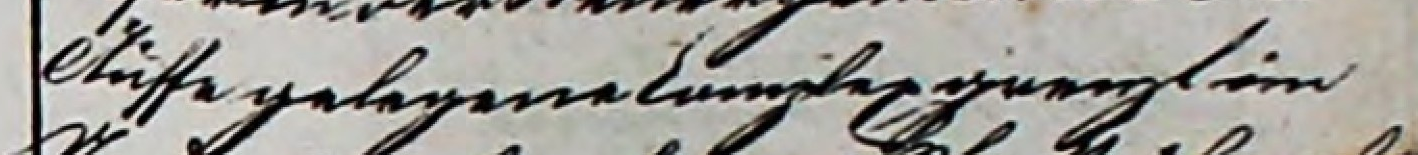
Ausse gelegene Complex grenzl im
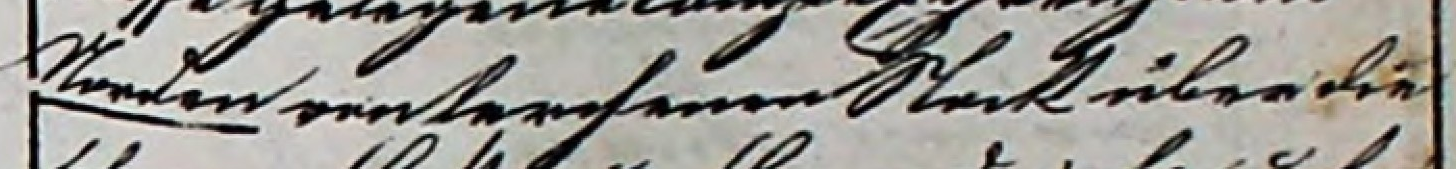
Norden renlerchenen Nock über die
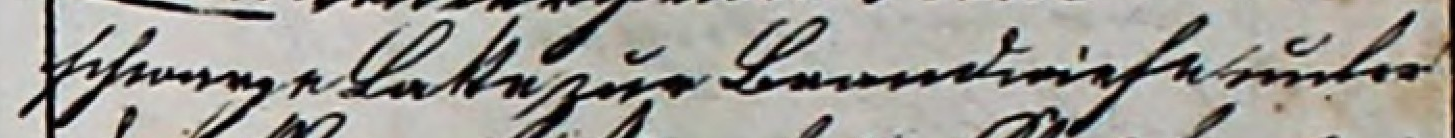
schwarz Lake zur Brandwiese unter
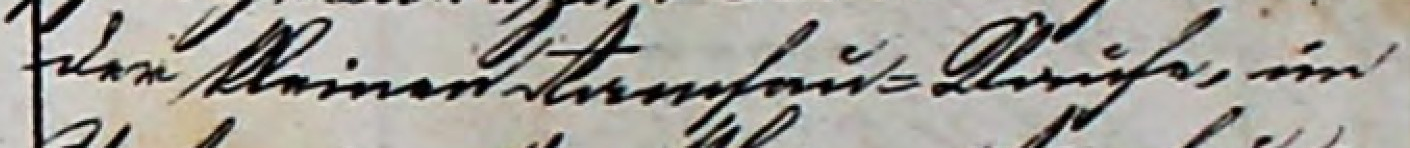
der kleinen Ramsau=Klause, in
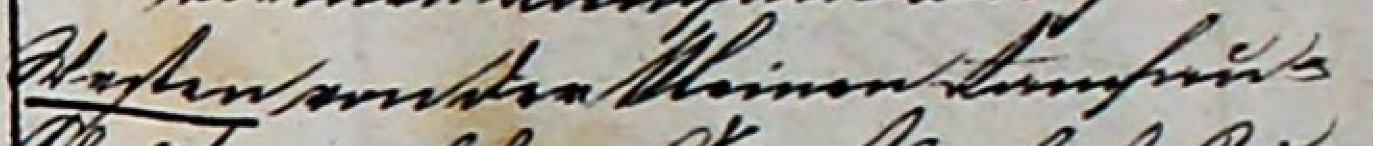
Wester von der kleinen Ramsau=
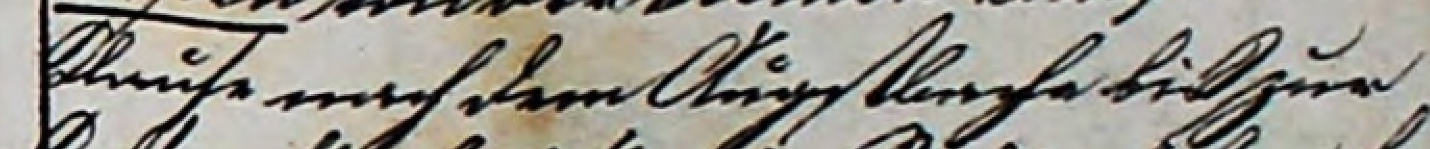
Klause nach dem Augstlenche bis zur
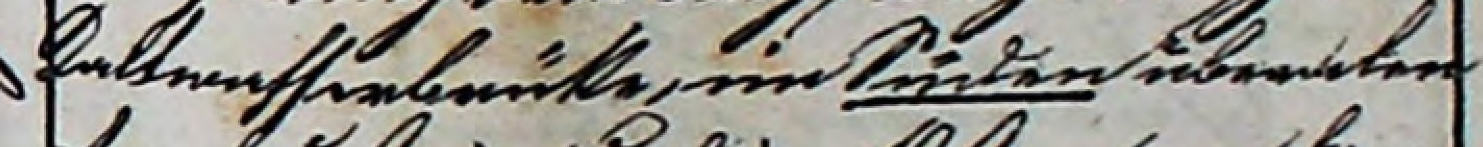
Kaltwasserbrüke, im Süden über den
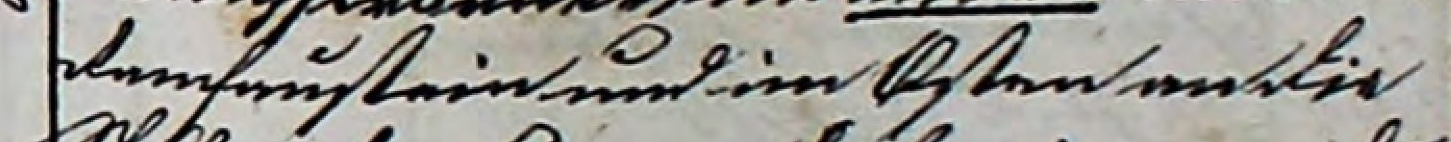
Ramsaustein und im Osten an die
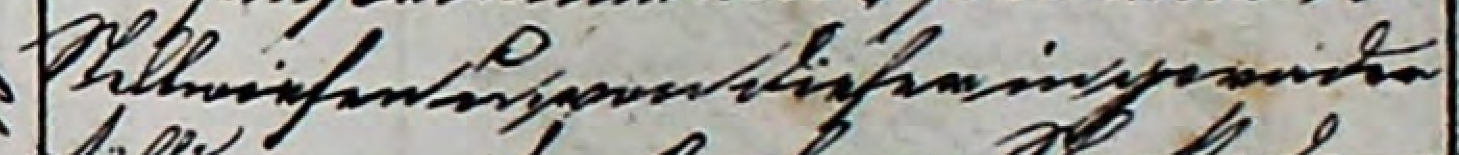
Stellwiesen u. von diesen in gernder
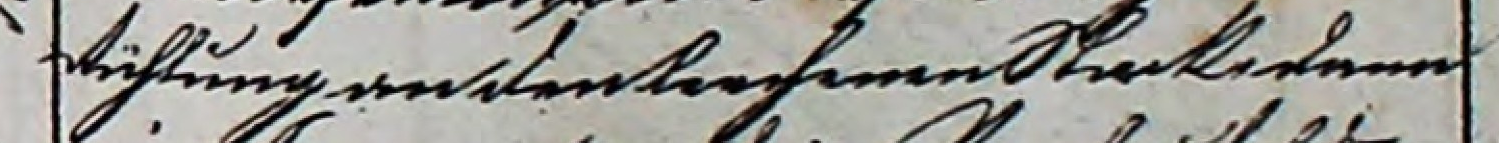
?ühlung an den lerchenen Stuck dann
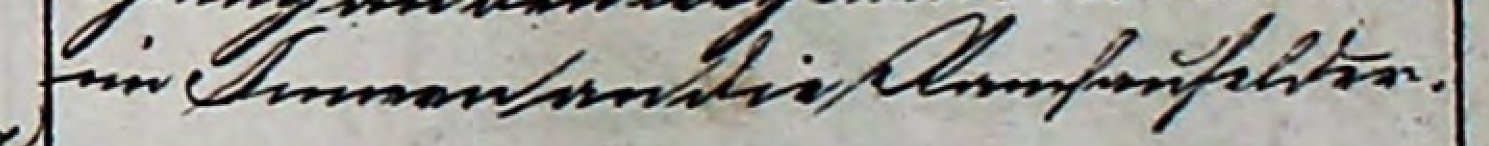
in Innern an die Ramsaufelder.
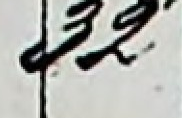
32
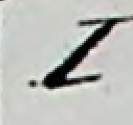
I
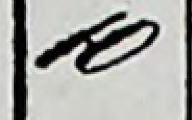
10
